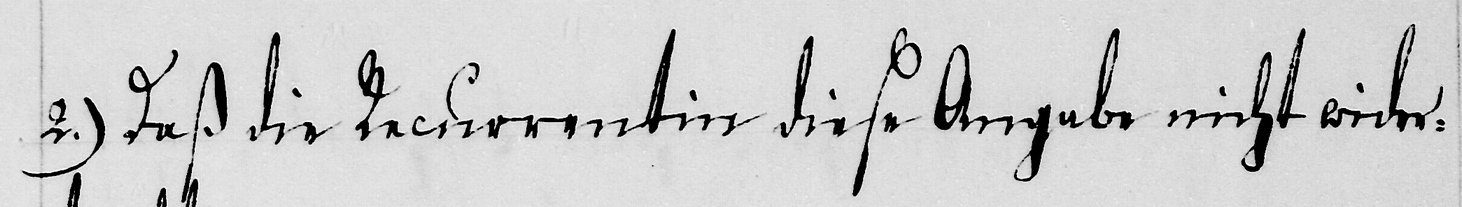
2.) Daß die Recurrentin diese Angabe nicht wider¬
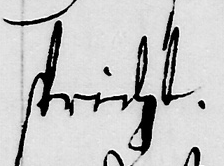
spricht.
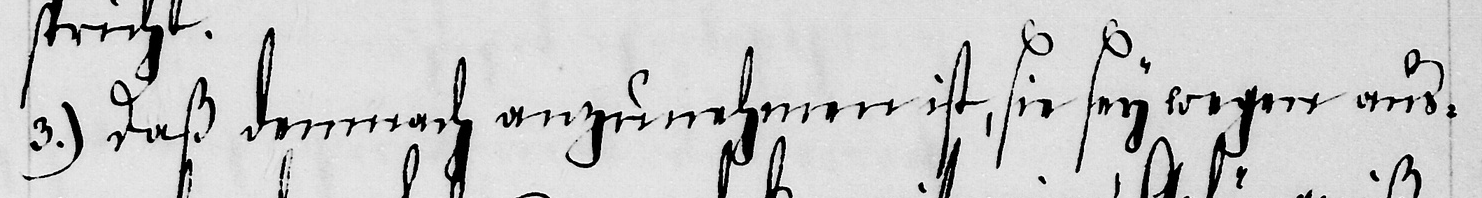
3.) Daß demnach anzunehmen ist, sie sey wegen aus¬
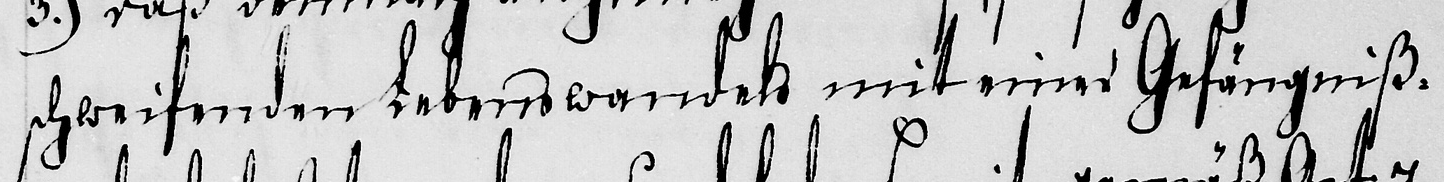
schweifenden Lebenswandels mit einer Gefängniß¬
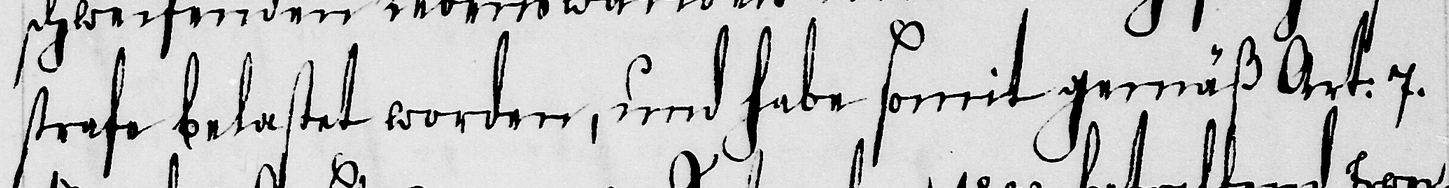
strafe belastet worden, und habe somit gemäß Art. 7.
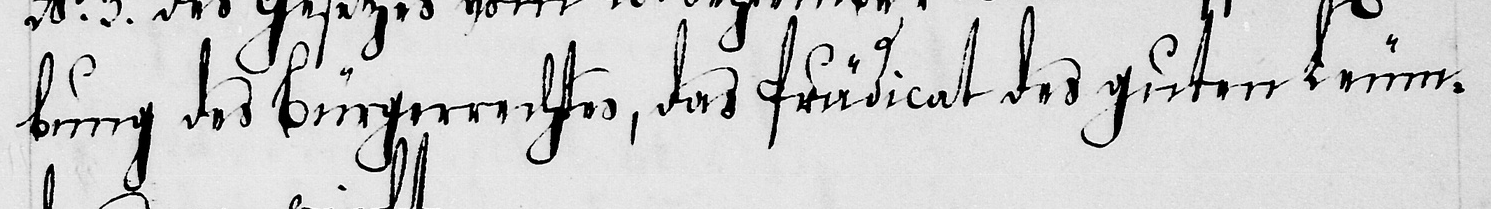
bung des Bürgerrechtes, das Prädicat des guten Leum¬
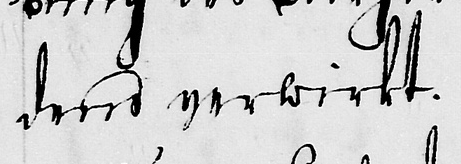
dens verwirkt.
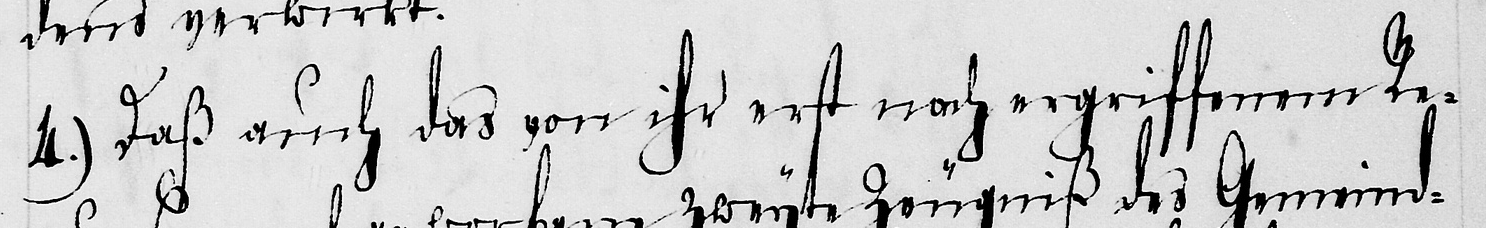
4.) Daß auch das von ihr erst nach ergriffenem Re¬
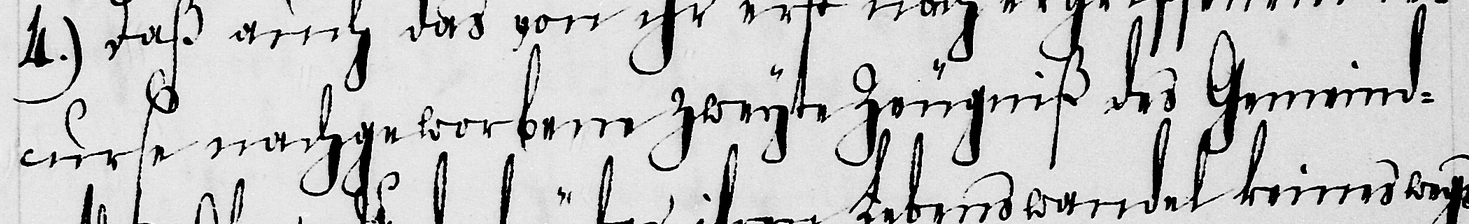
curse nachgeworbene zweyte Zeugniß des Gemeind¬
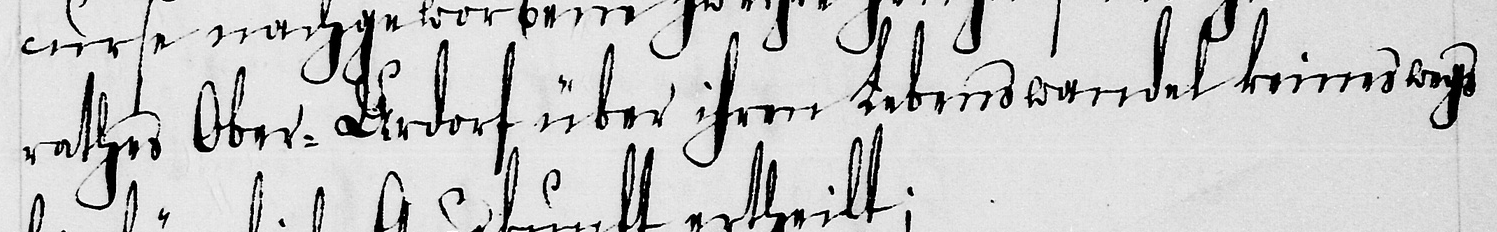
rathes Ober-Urdorf über ihren Lebenswandel keineswegs
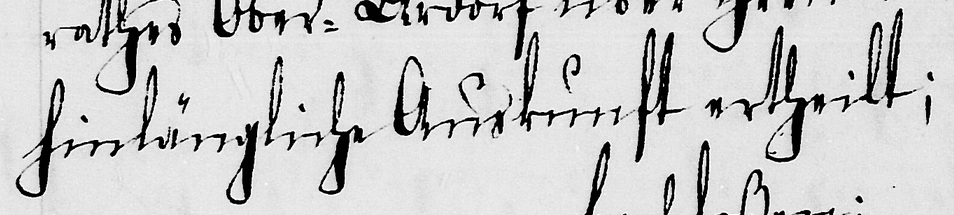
hinlängliche Auskunft ertheilt;
